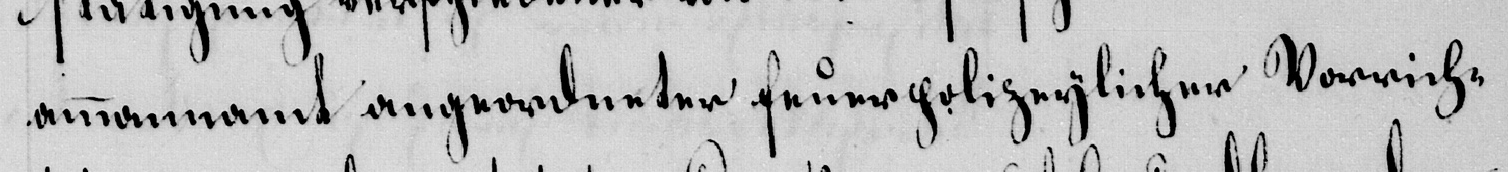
ammannamt angeordneten feuerpolizeylicher Vorrich¬
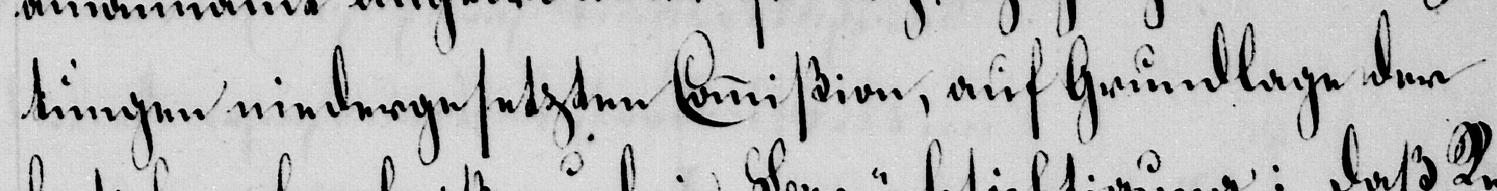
tungen niedergesetzten Commißion, auf Grundlage der
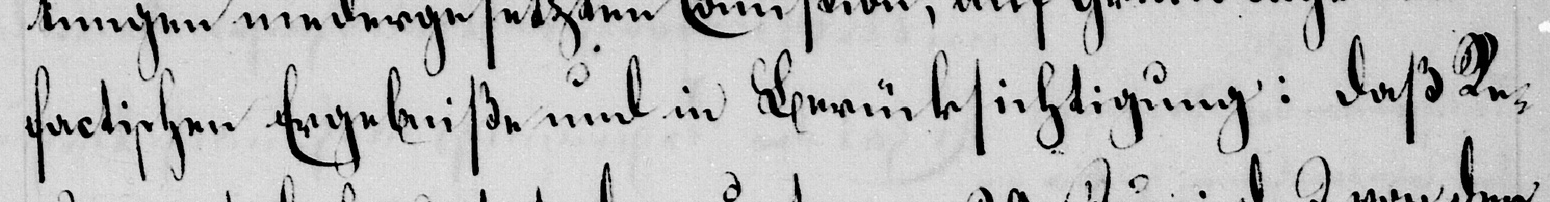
factischen Ergebniße und in Berücksichtigung: daß Re¬
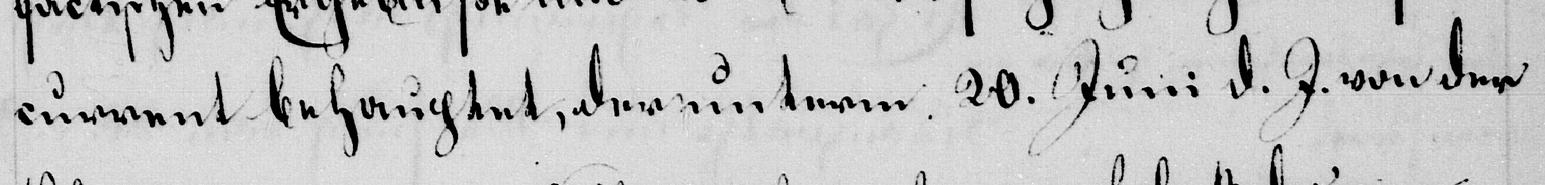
current behauptet, der unterm 20. Juni d. J. von der
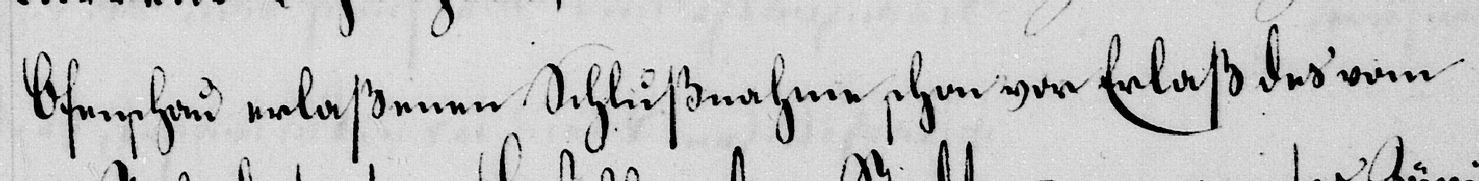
Ofenschau erlaßenen Schlußnahme schon vor Erlaß des vom
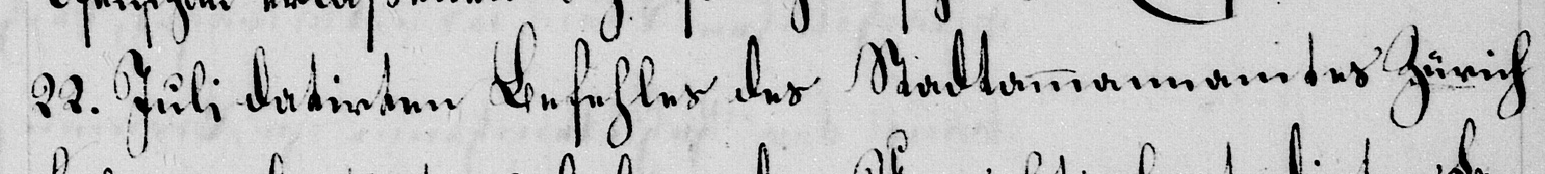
22. Juli datirten Befehles des Stadtammannamtes Zürich
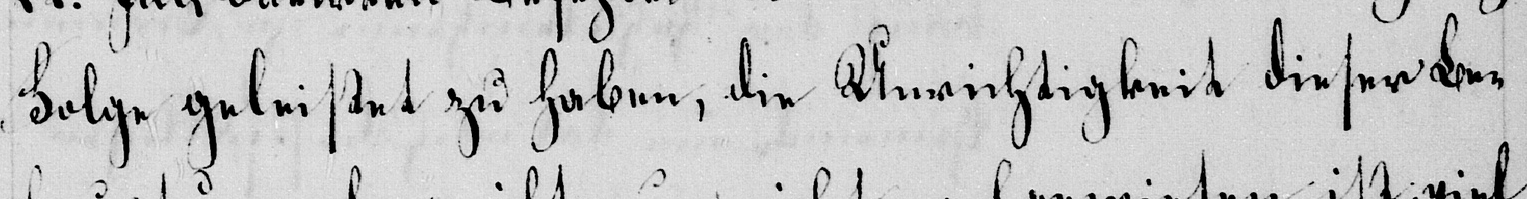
Folge geleistet zu haben, die Unrichtigkeit dieser Be¬
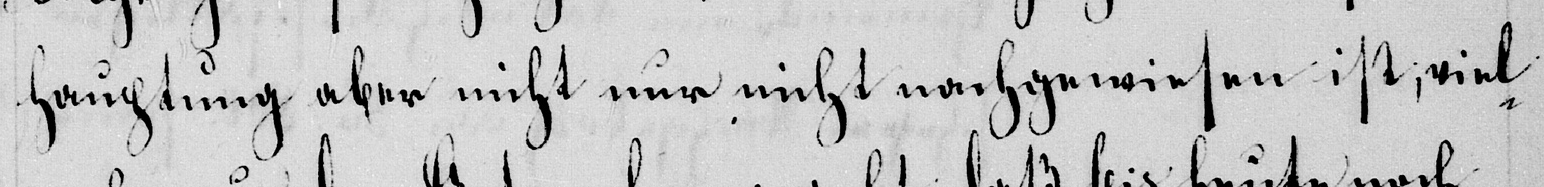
hauptung aber nicht nur nicht nachgewiesen ist, viel
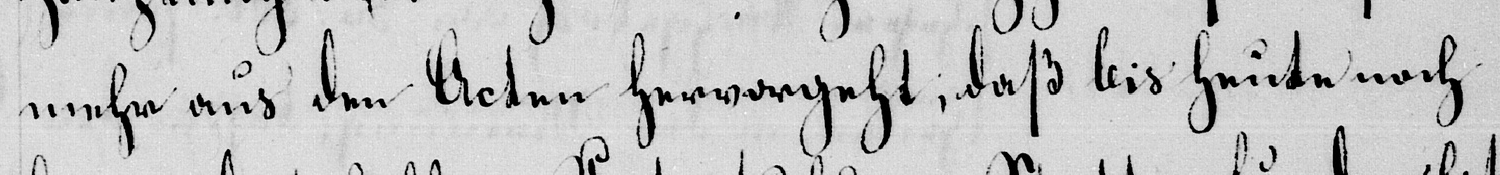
mehr aus den Acten hervorgeht, daß bis heute noch
